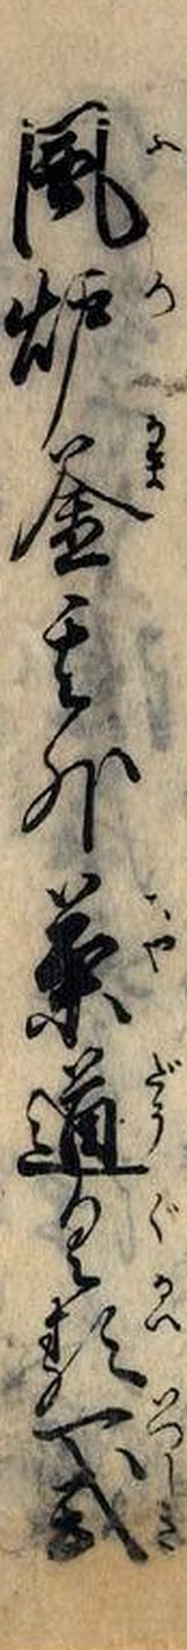風炉釜其外茶道具類一式
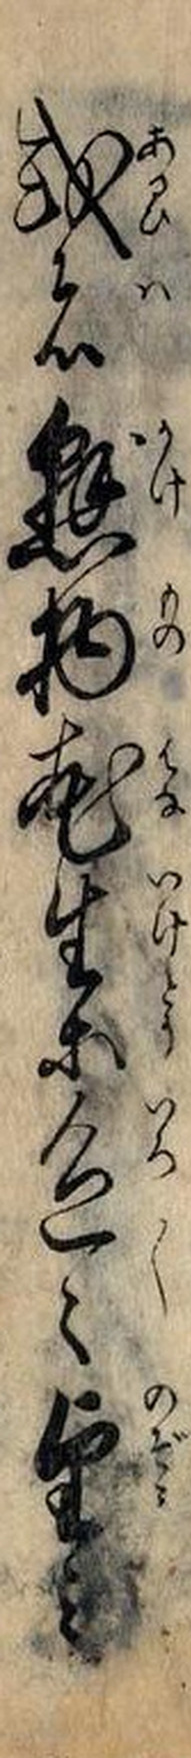或者懸物花生等色々望之
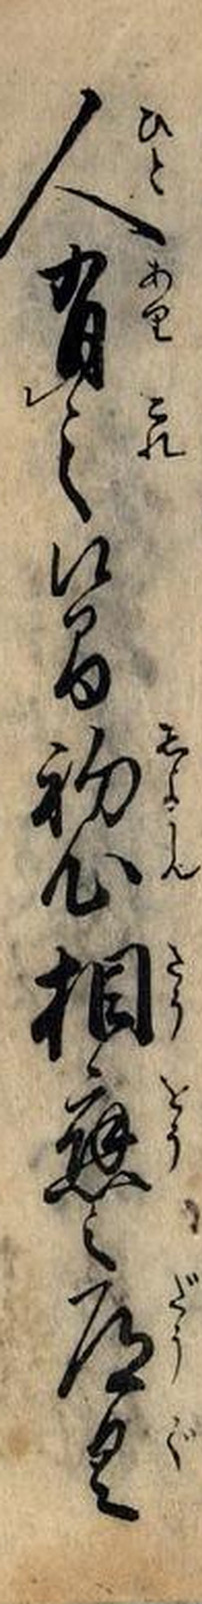人有之候間初心相應之道具
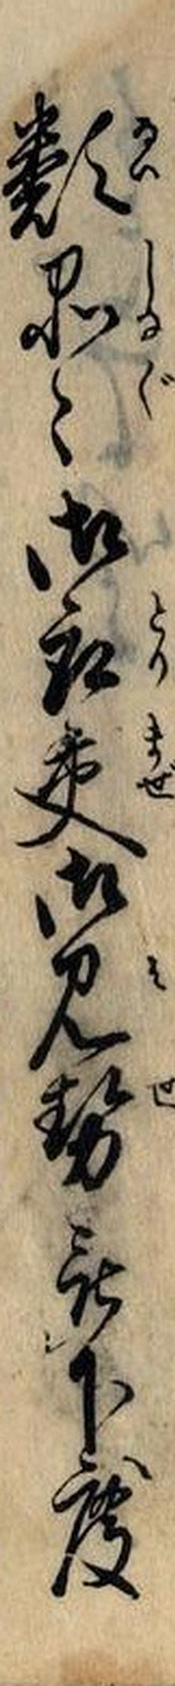類品々御取交御見勢被下度
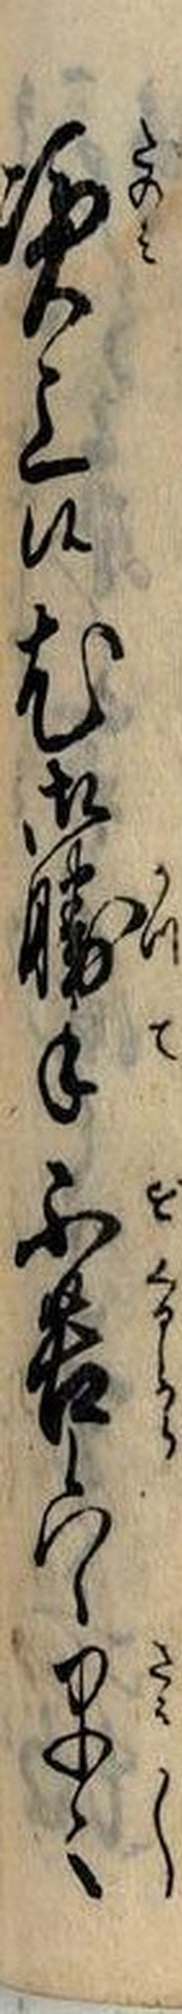憑上候尤御勝手不苦候はゝ早々
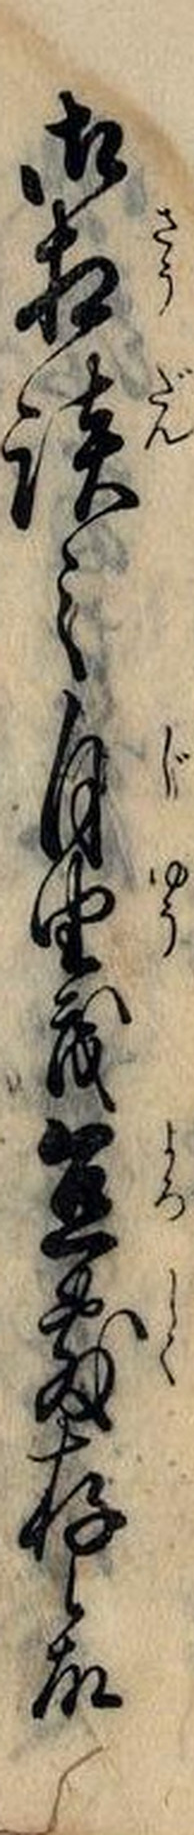御相談之自由も宜敷存候故
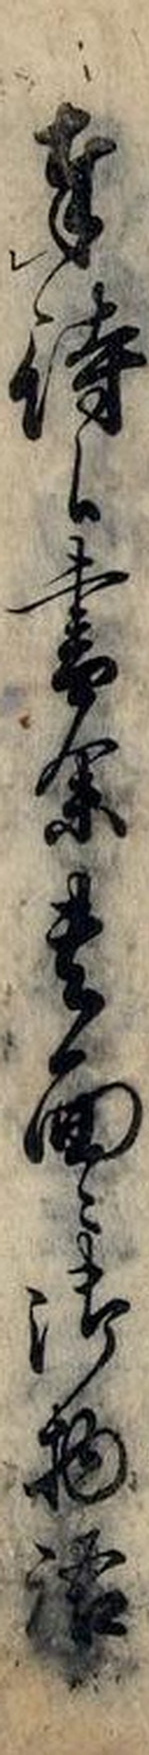奉待候書余貴面に御物語

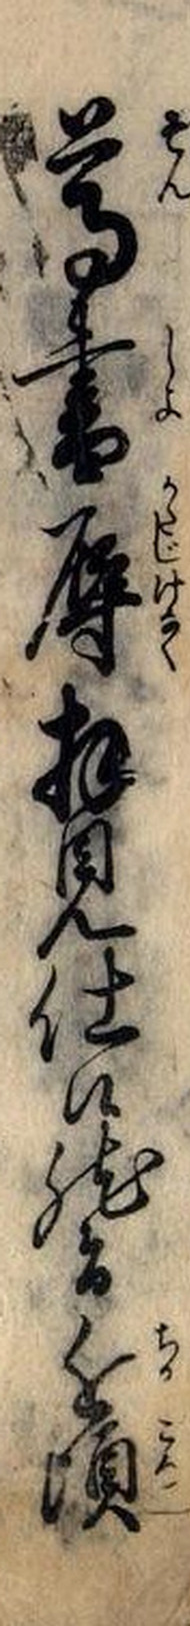尊書辱拝見仕候然者近頃
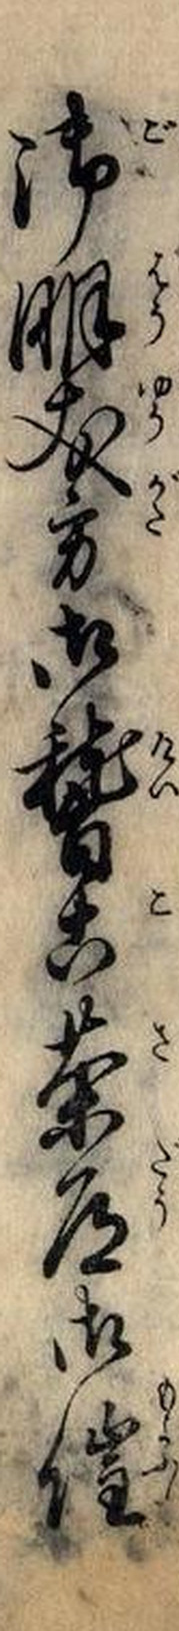御朋友方御稽古茶道御催
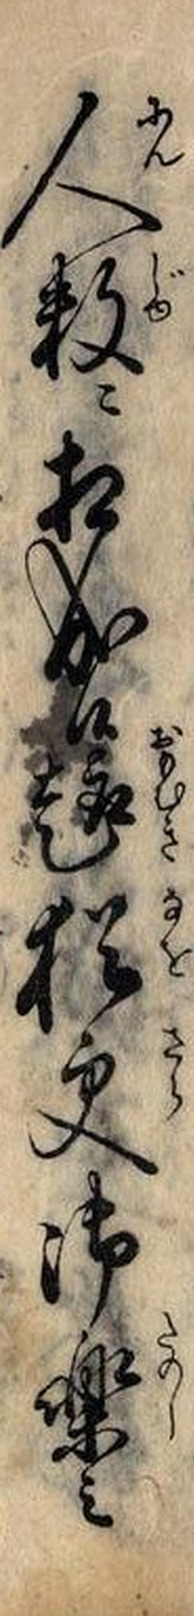人数に相成候趣猶更御楽み
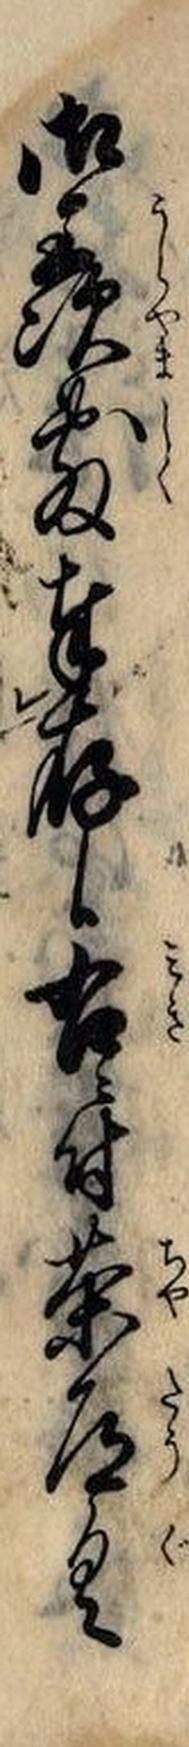御羨敷奉存候右に付茶道具
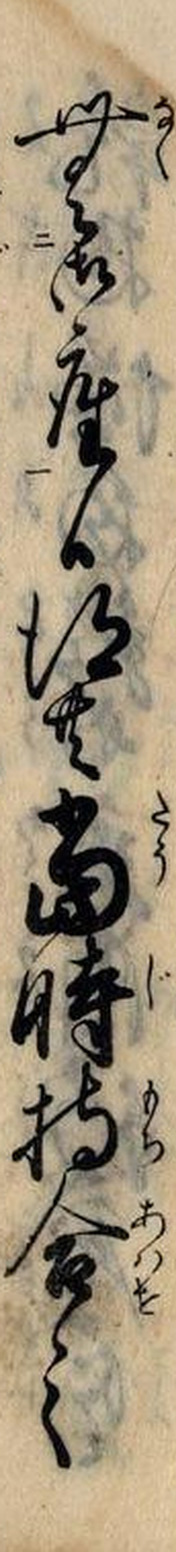無御座候得共當時持合之
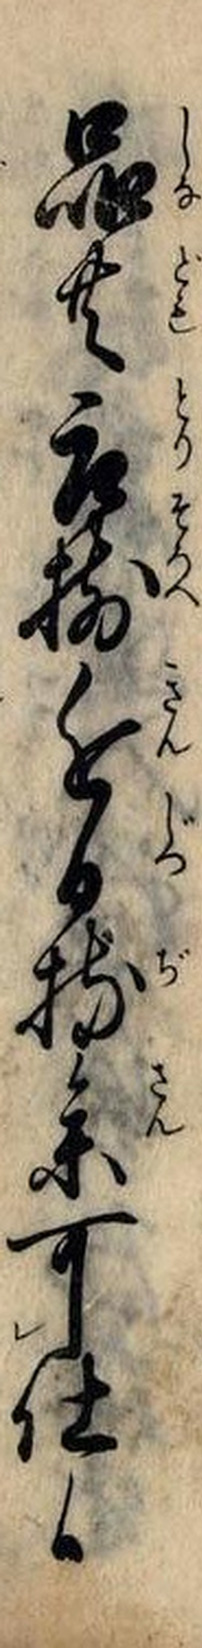品共取揃近日持参可仕候
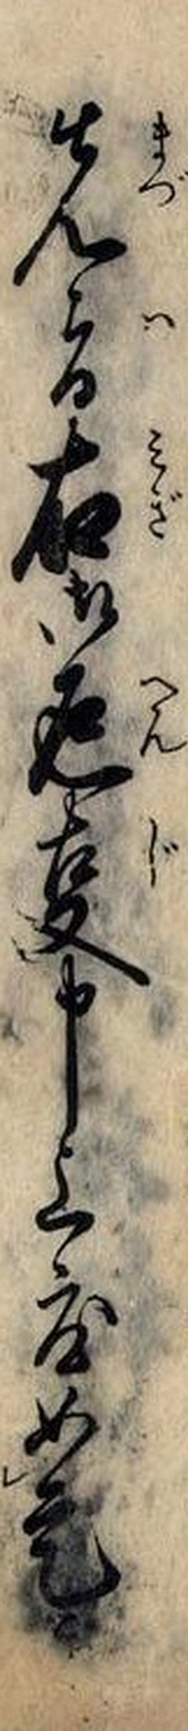先者右御返事申上度如是
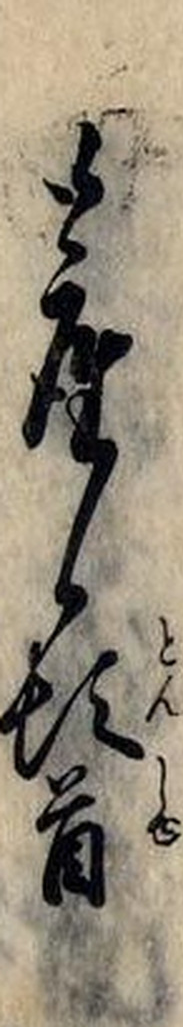御座候頓首
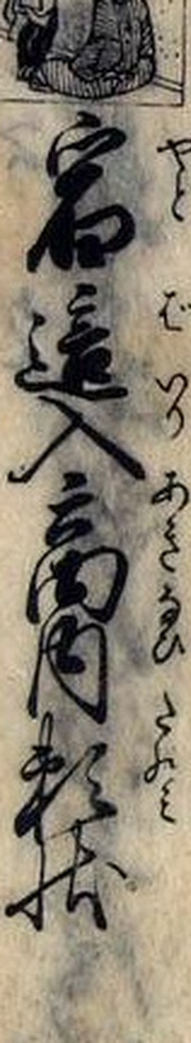宿這入商内頼状
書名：大成用文章（往来物）
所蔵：福井県文書館 Fukui Prefectural Archives
